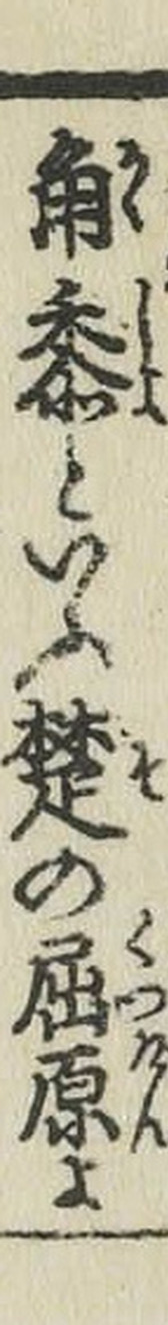角黍といふ楚の屈原よ
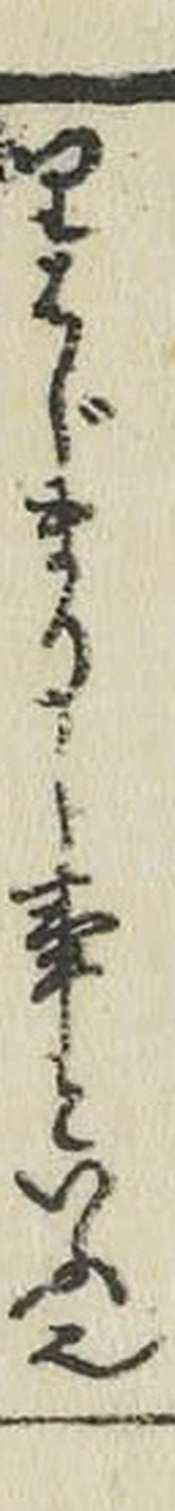りはじまりし事といふ也
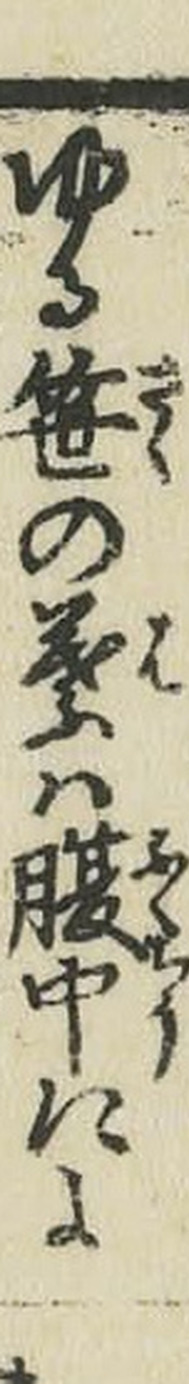ゆる笹の葉は腹中によ
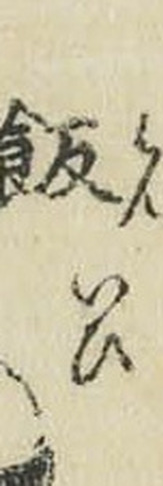飯いひ
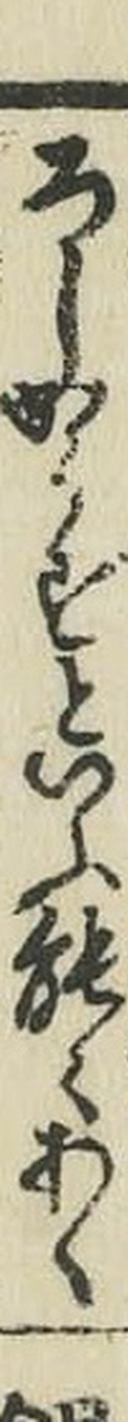ろしからずといふ能々あく
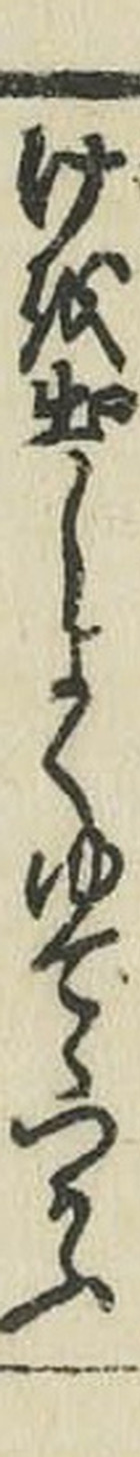けを出しよくゆてゝつかふ
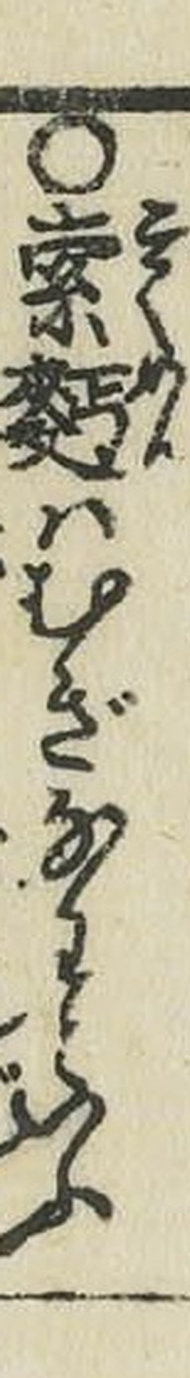○索麺はむぎなわといふ
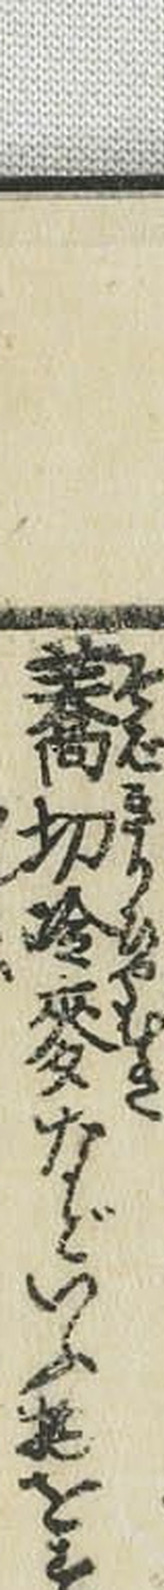蕎切冷麦などいふ物をす
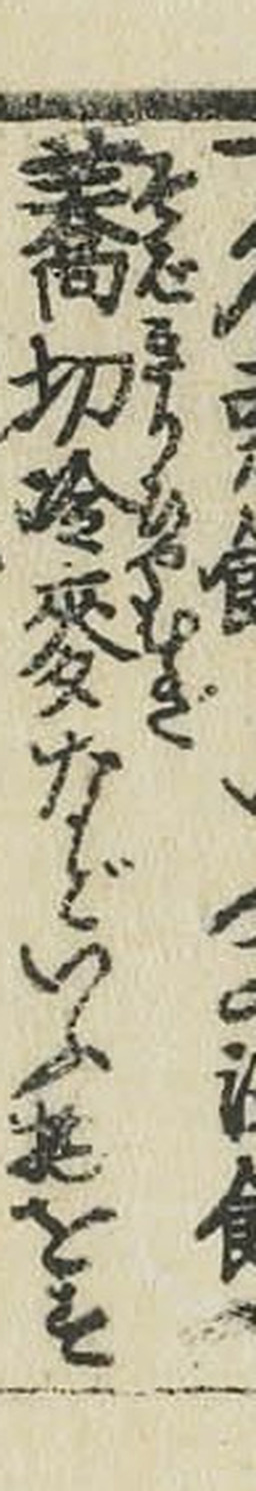蕎切冷麦などいふ物をす
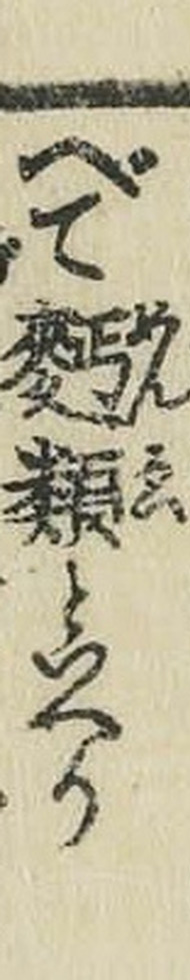べて麺類といへり
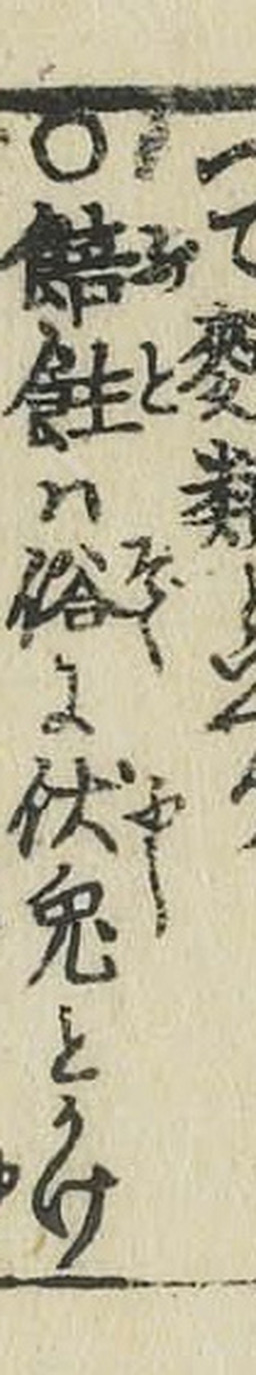○餢飳は俗に伏兎とかけ
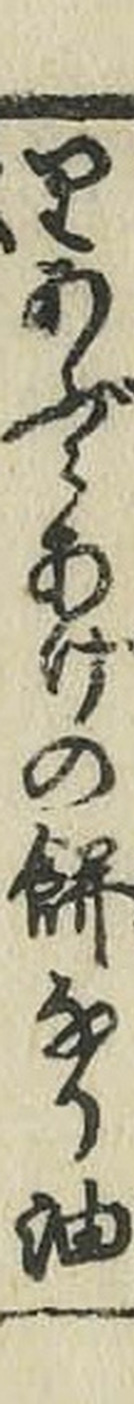りあぶらあげの餅なり油
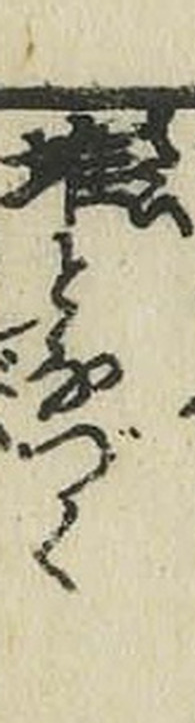堆となづく
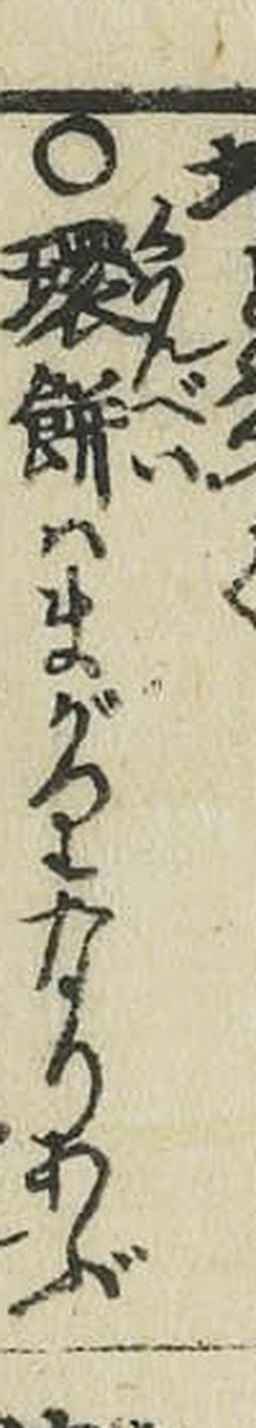○環餅はまがりなりあぶ
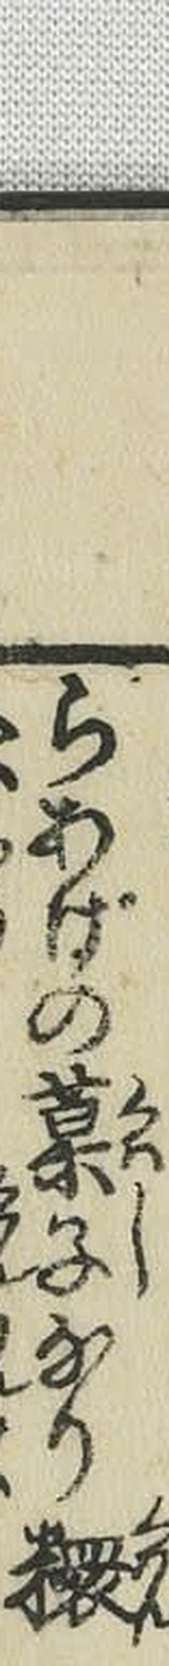らあげの菓子なり糫
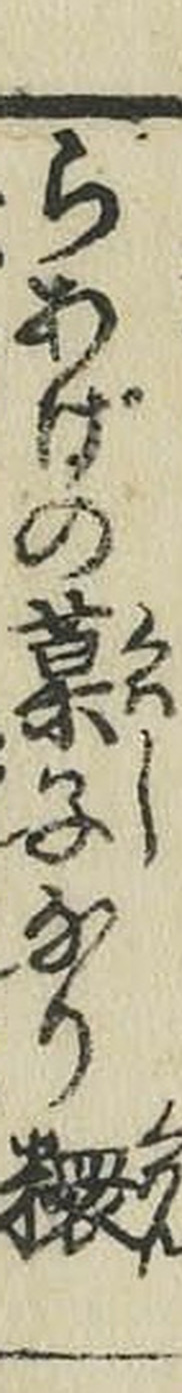らあげの菓子なり糫
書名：増補頭書訓蒙図彙大成 10巻 7:巻之14-16
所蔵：東京学芸大学教育コンテンツアーカイブ
